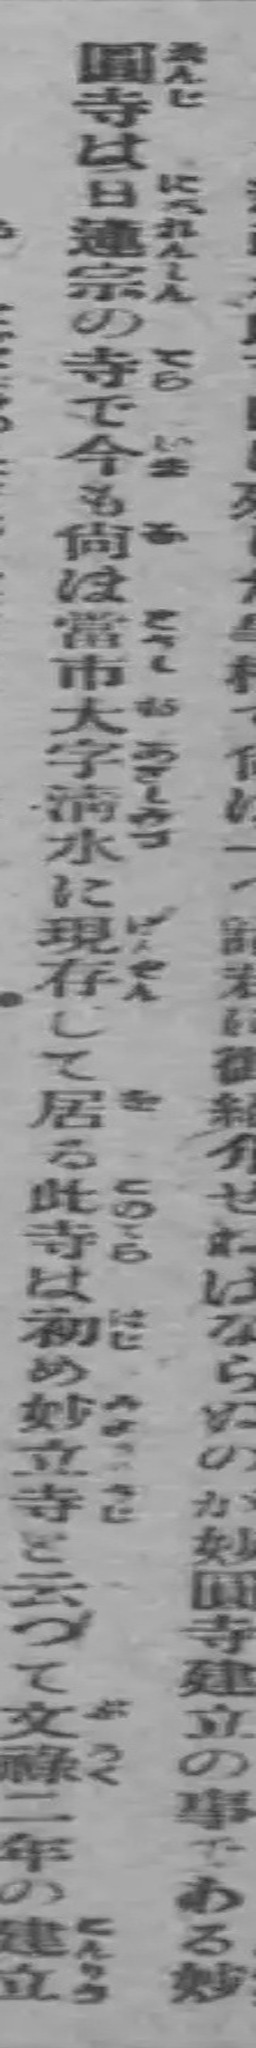妙円寺円寺は日蓮宗の寺で今も尚ほ当市大字清水に現存して居る此寺は初め妙立寺と云つて文禄二年の建立
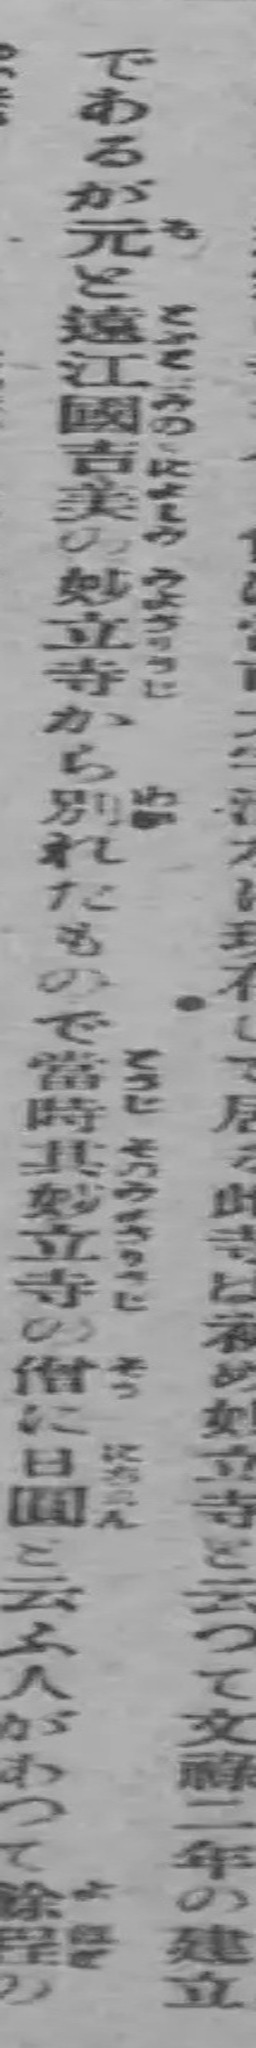であるが元と遠江国吉美の妙立寺から別れたもので当時其妙立寺の僧に日円と云ふ人があつて余程の
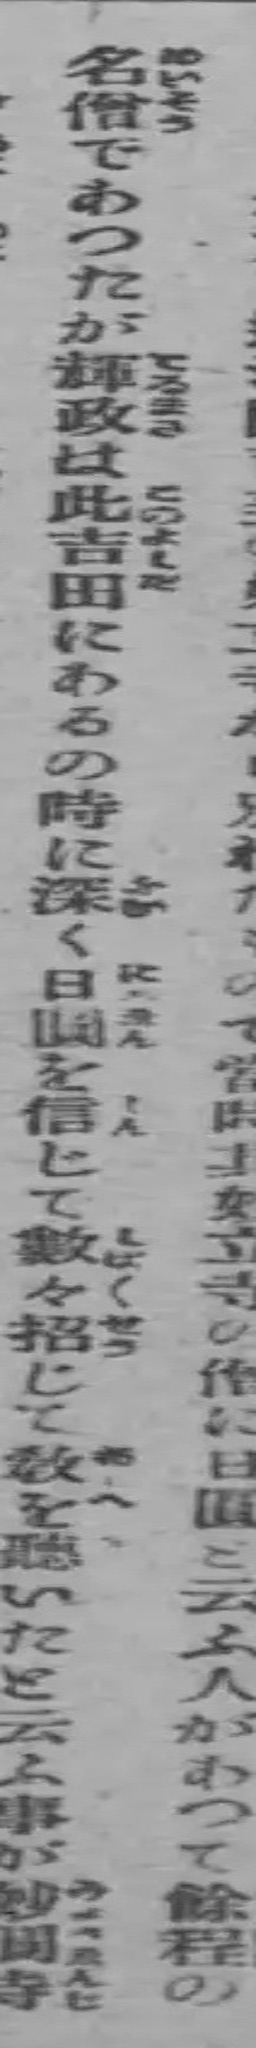輝政と日円名僧であつたが輝政は此吉田にあるの時に深く日円を信じて数々招じて教を聴いと云ふ事が妙円寺
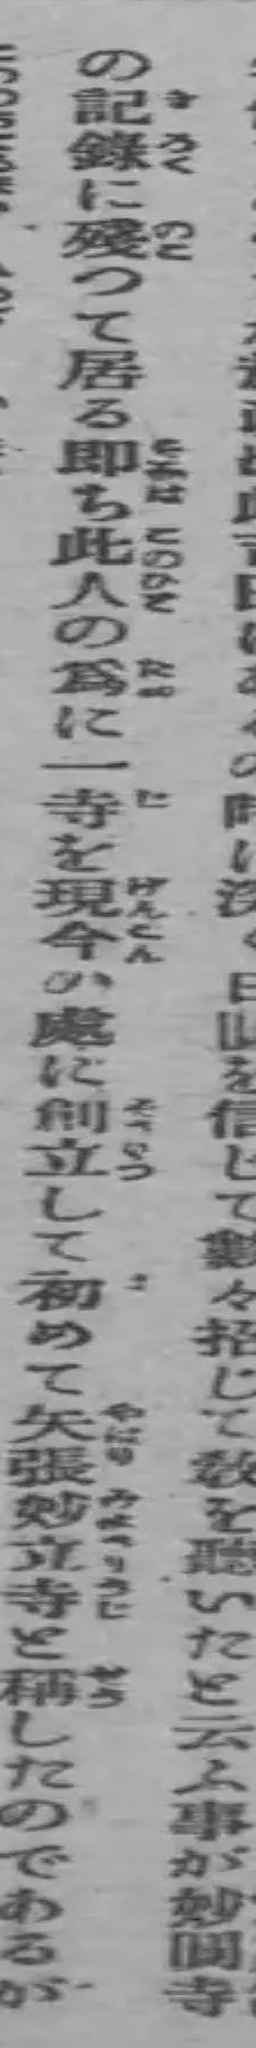の記録に残つて居る即ち此人の為に一寺を現今の処に創立して初めて矢張妙立寺と称したのであるが
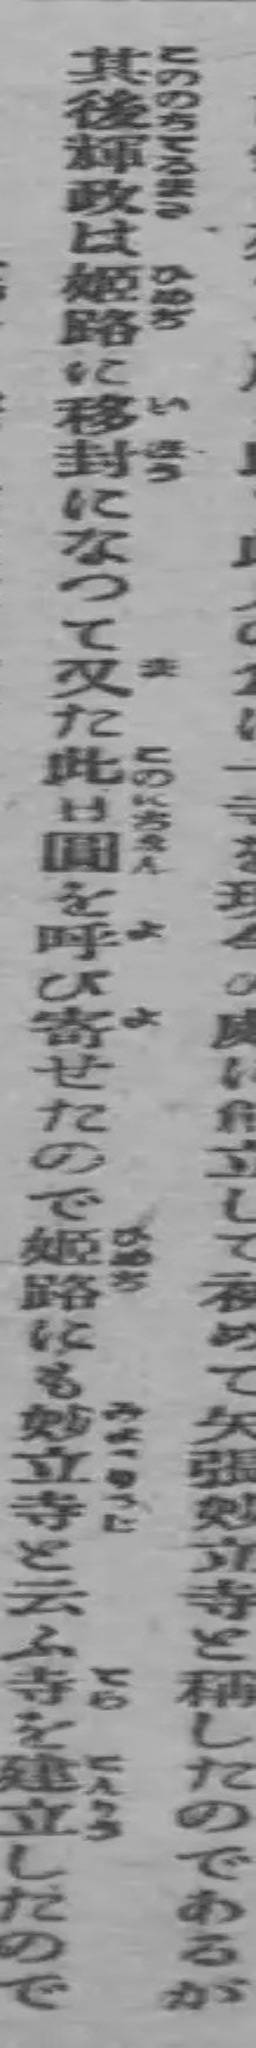其後輝政は姫路に移封になつて又た此日円を呼び寄せたので姫路にも妙立寺と云ふ寺を建立したので
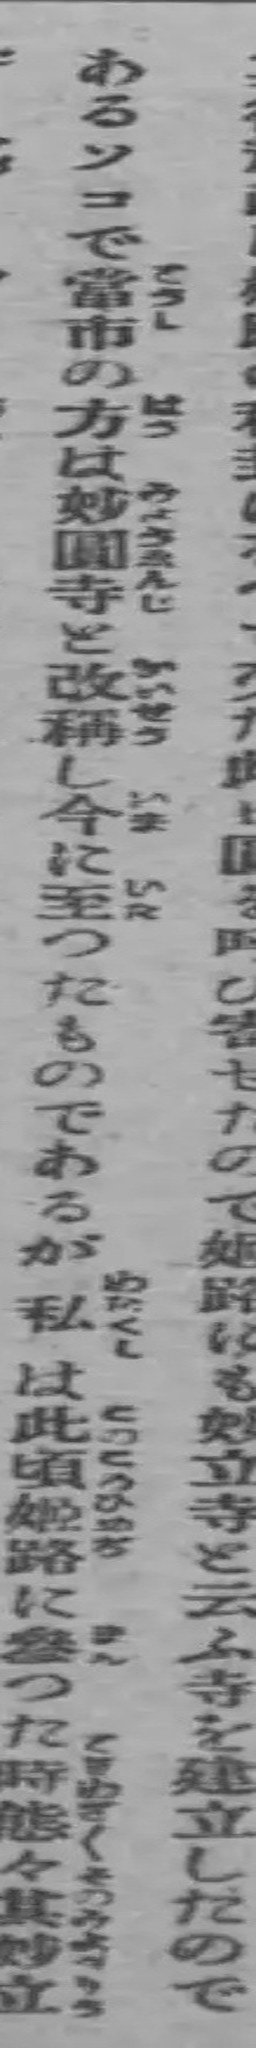あるソコで当市の方は妙円寺と改称し今に至つたものであるが私は此頃姫路に参つた時態々其妙立
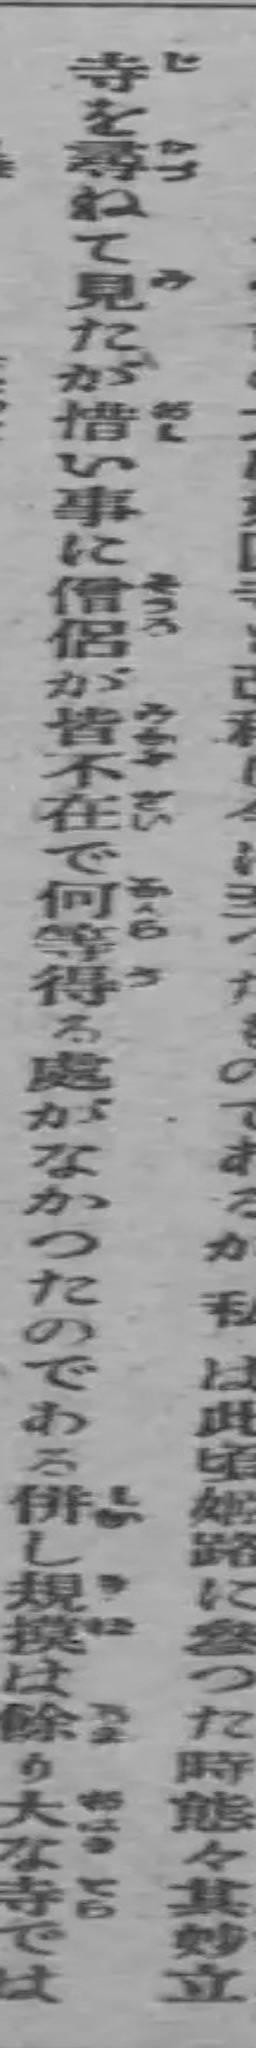寺を尋ねて見たが惜い事に僧侶が皆不在で何等得る処がなかつたのである併し規模は余り大な寺では
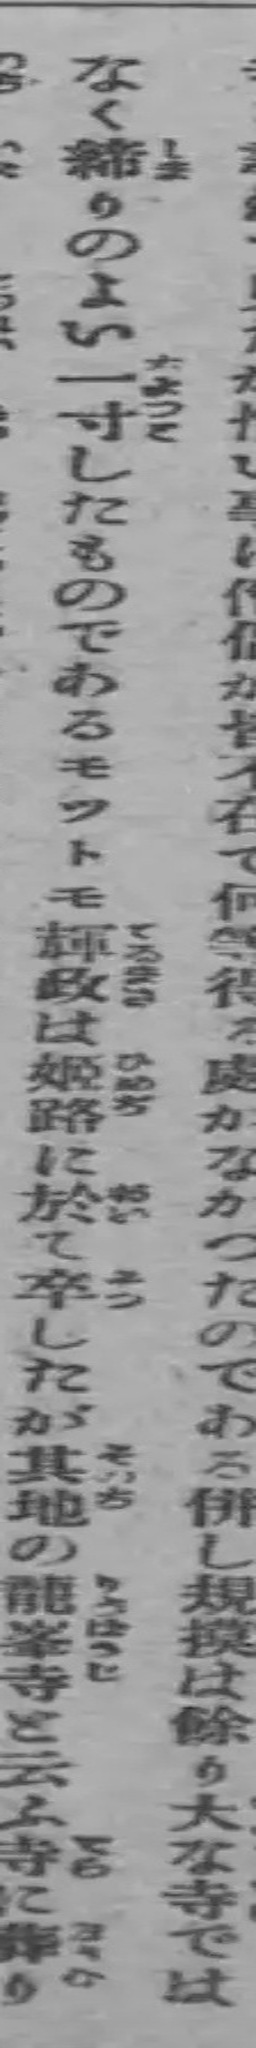なく締りのよい一寸したものであるモツトモ輝政は姫路に於て卒したが其地の龍峯寺と云ふ寺に葬り
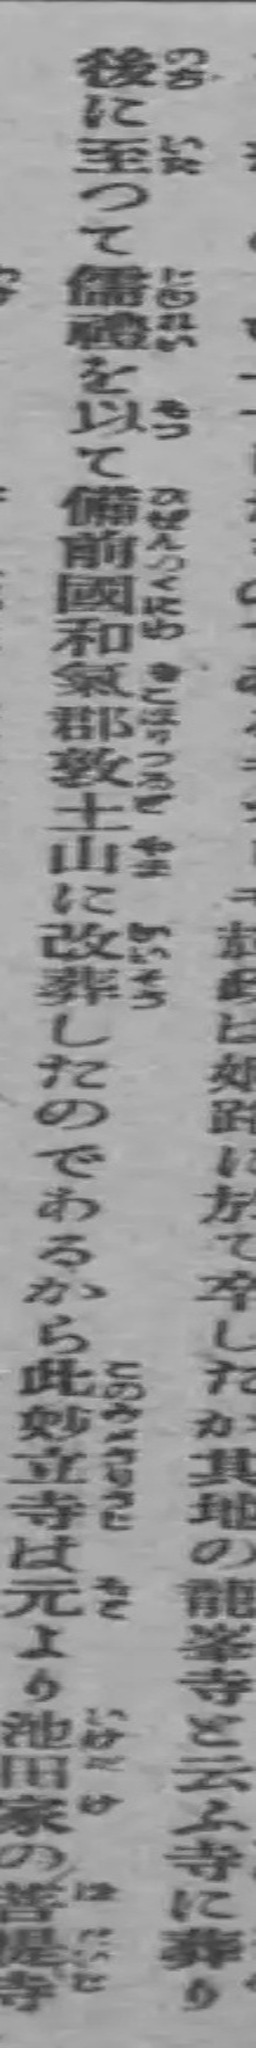後に至つて儒礼を以て備前国和気郡敦土山に改葬したのであるから此妙立寺は元より池田家の菩提寺
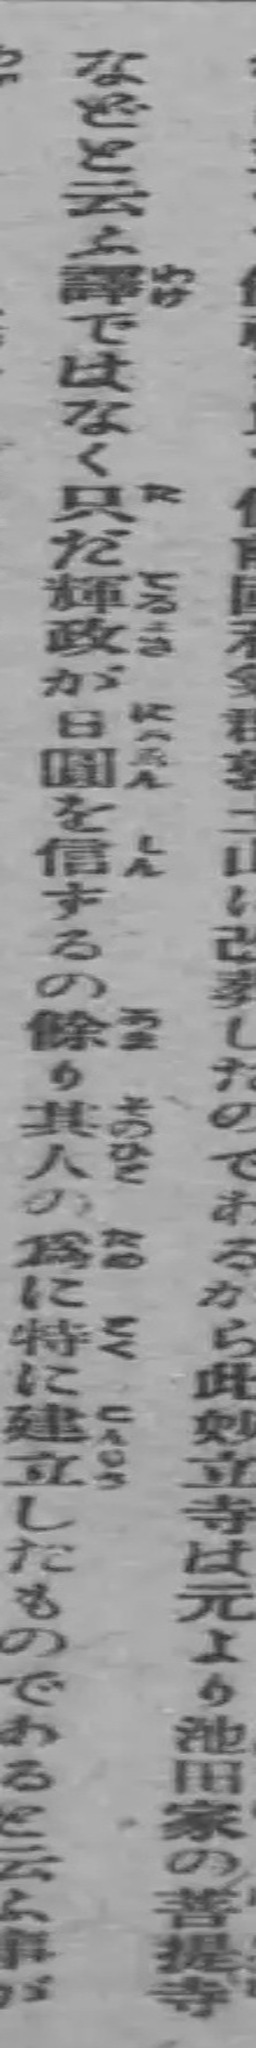などと云ふ訳ではなく只だ輝政が日円を信ずるの余り其人の為に特に建立したものであると云ふ事が
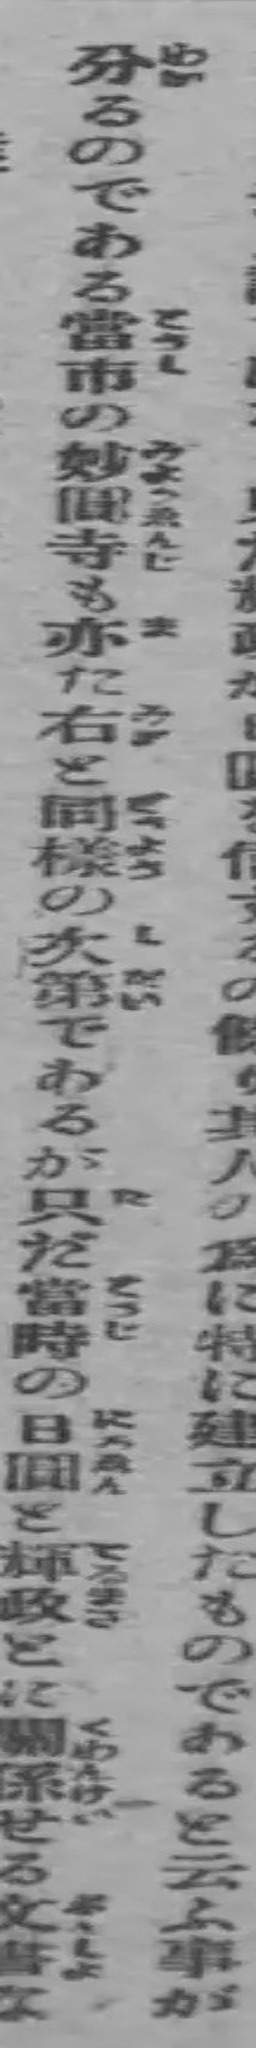分るのである当市の妙円寺も亦た右と同様の次第であるが只だ当時の日円と輝政とに関係せる文書な
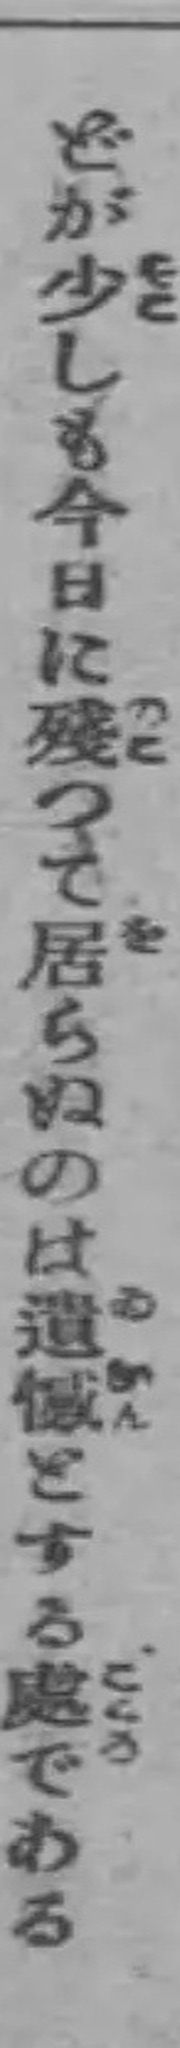どが少しも今日に残つて居らぬのは遺憾とする処である
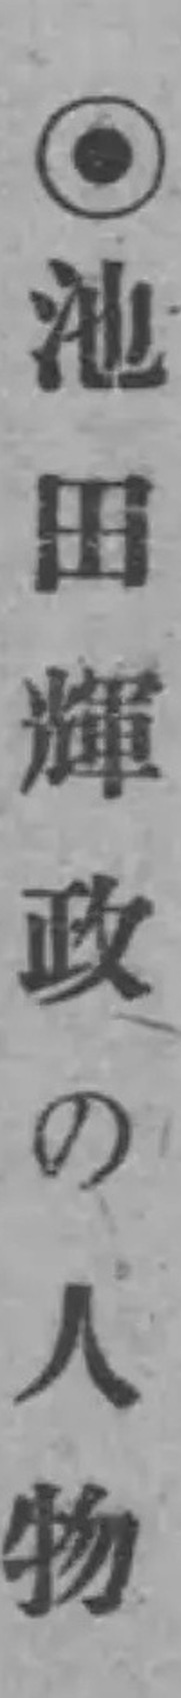⦿池田輝政の人物
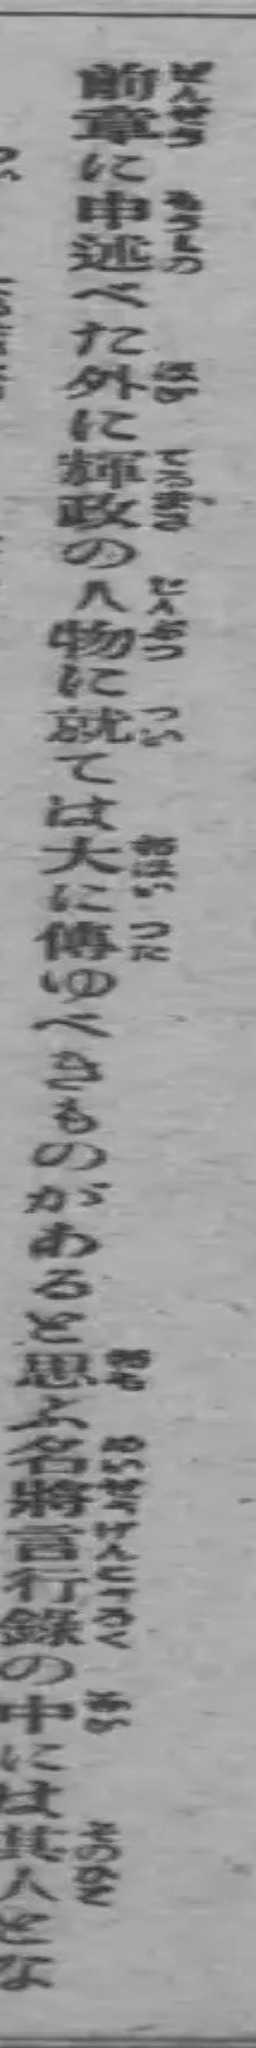前章に申述べた外に輝政の人物に就ては大に伝ゆべきものがあると思ふ名将言行録の中には其人とな
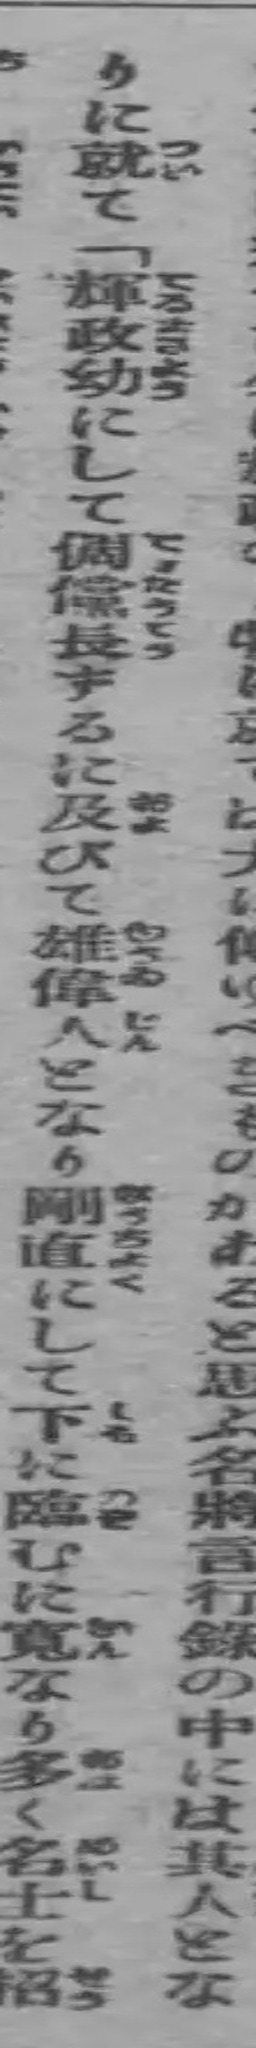輝政の人物りに就て「輝政幼にして倜儻長ずるに及びて雄偉人となり剛直にして下に臨むに寛なり多く名士を招
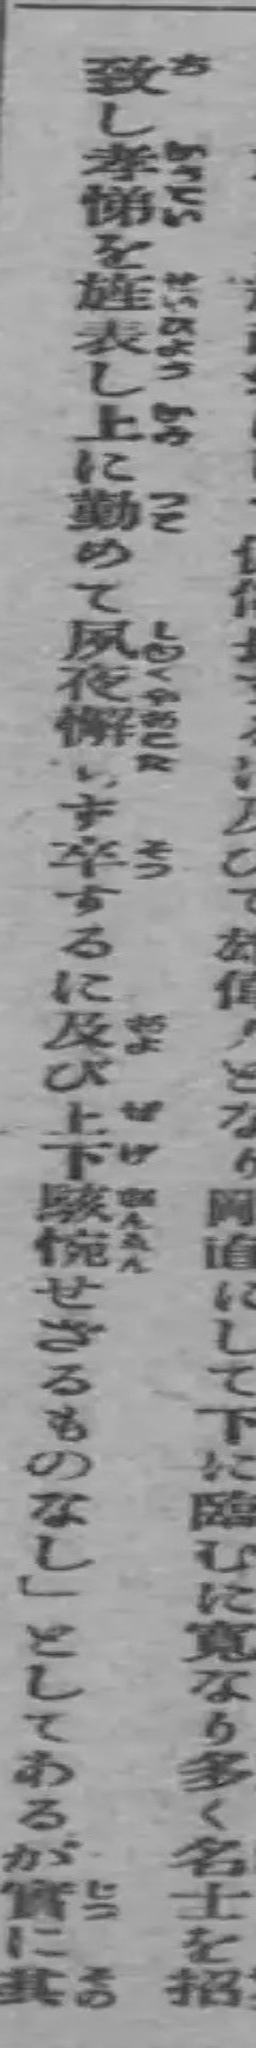致し孝悌を旌表し上に勤めて夙夜懈らず卒するに及び上下駭惋せざるものなし」としてあるが実に其
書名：豊橋市史談
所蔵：国立国会図書館 National Diet Library, JAPAN
